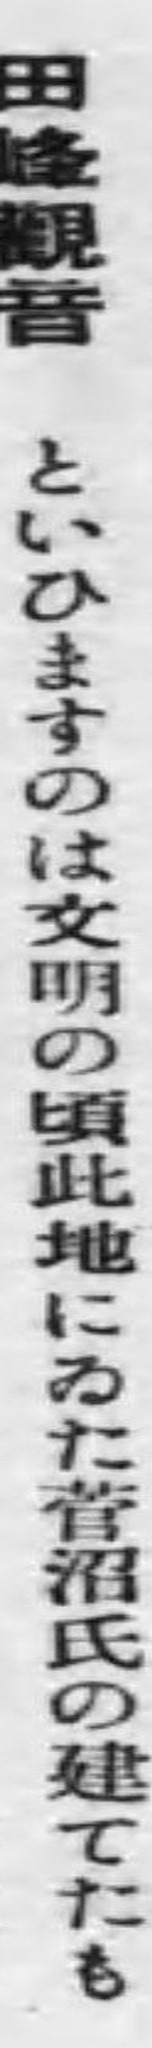田峰觀音といひますのは文明の頃此地にゐた菅沼氏の建てたも
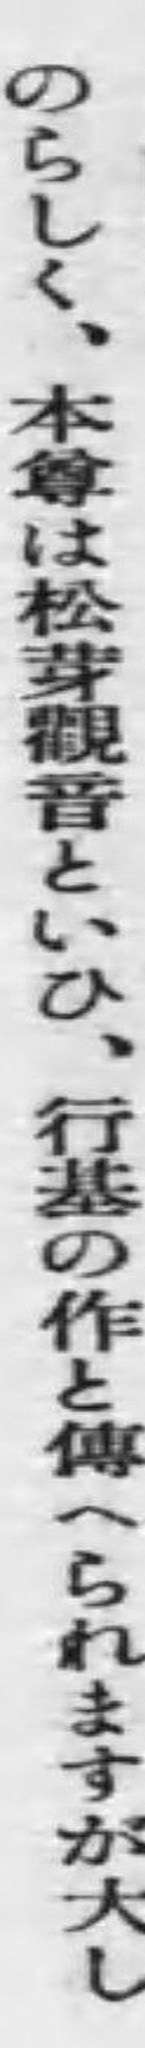のらしく、本尊は松芽觀音といひ、行基の作と傳へられますが大し
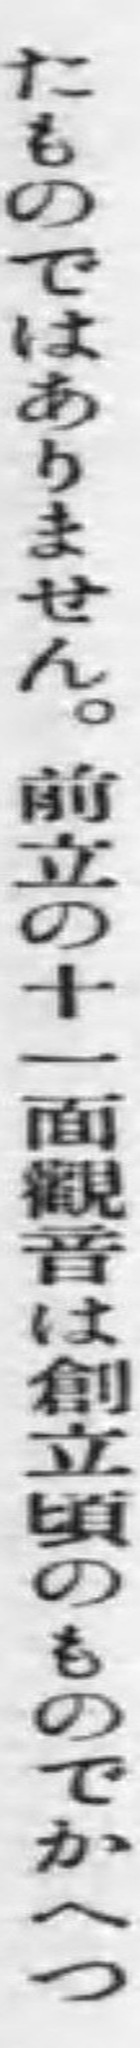たものではありません。前立の十一面觀音は創立頃のものでかへつ
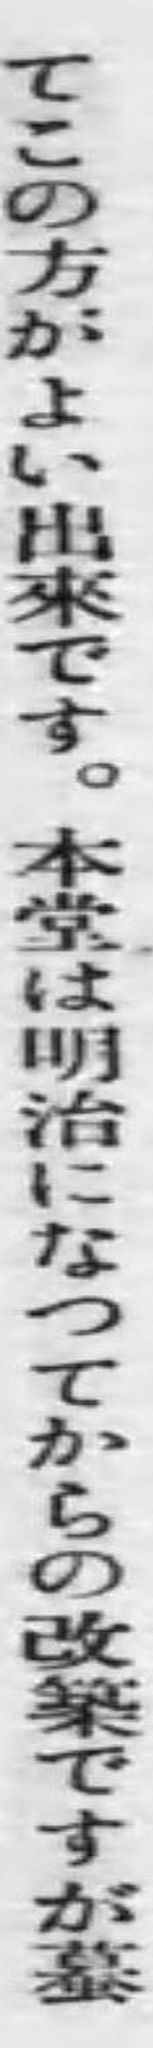てこの方がよい出來です。本堂は明治になつてからの改築ですが蟇
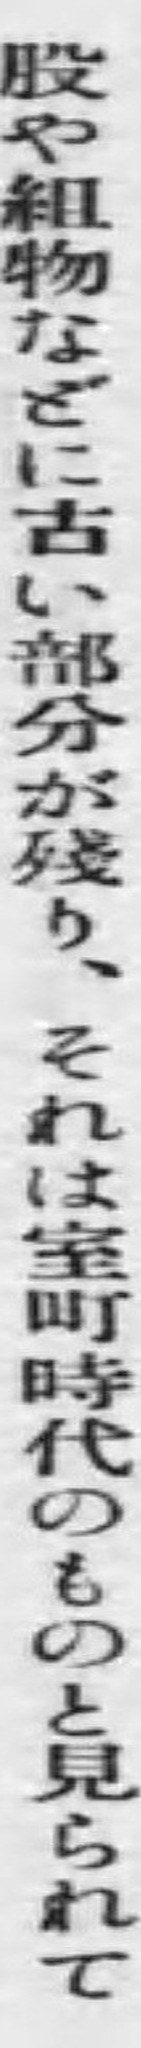股や組物などに古い部分が殘り、それは室町時代のものと見られて
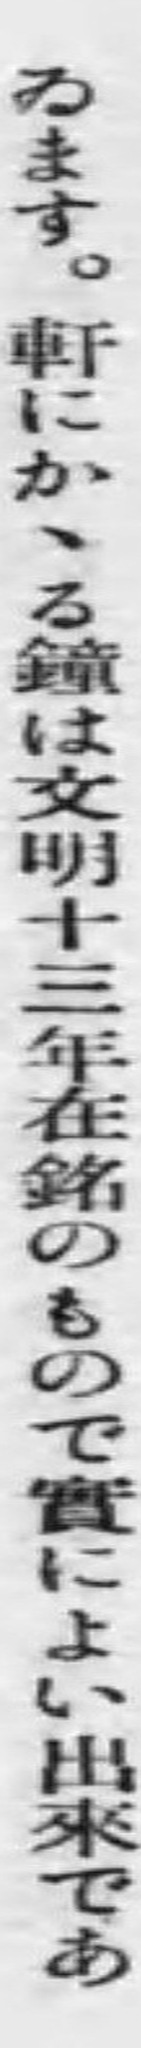ゐます。軒にかヽる鐘は文明十三年在銘のもので實によい出來であ
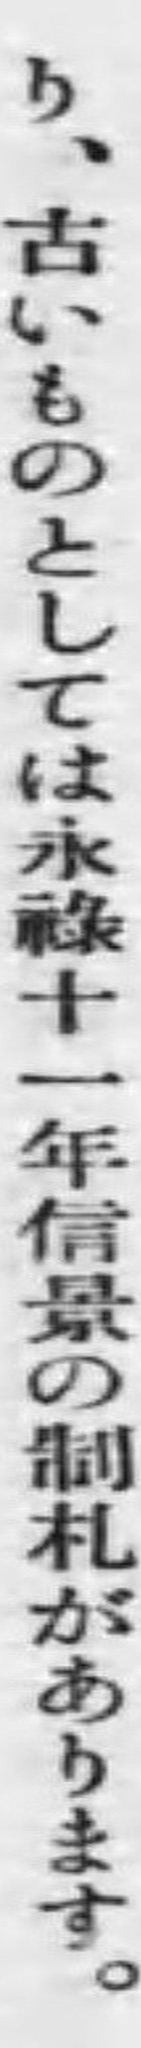り、古いものとしては永祿十一年信景の制札があります。
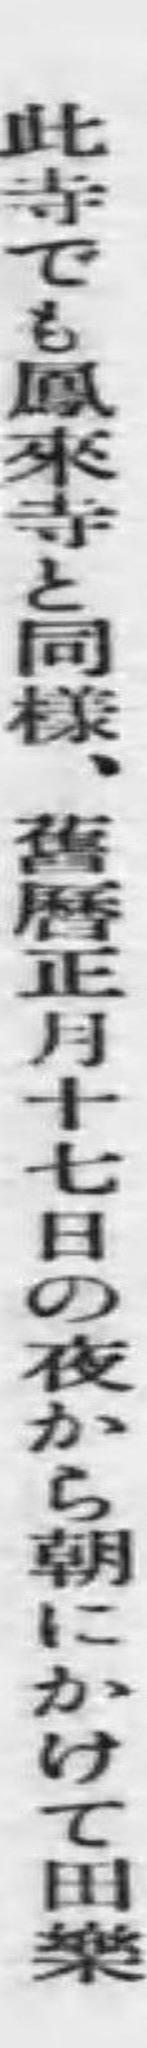此寺でも鳳來寺と同様、舊暦正月十七日の夜から朝にかけて田樂
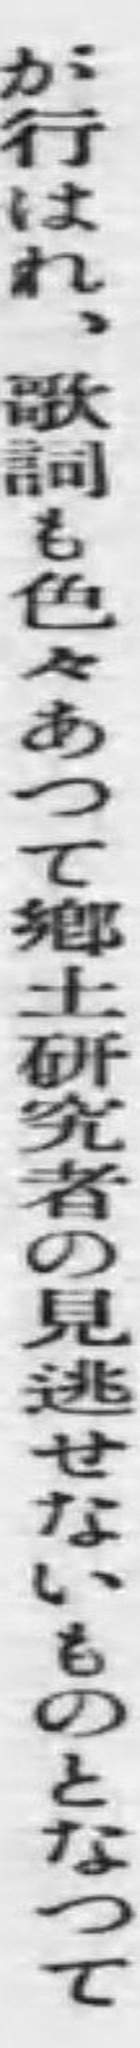が行はれ、歌詞も色々あつて郷土研究者の見逃せないものとなつて
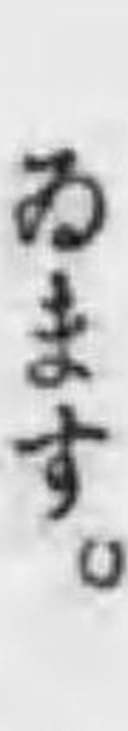ゐます。
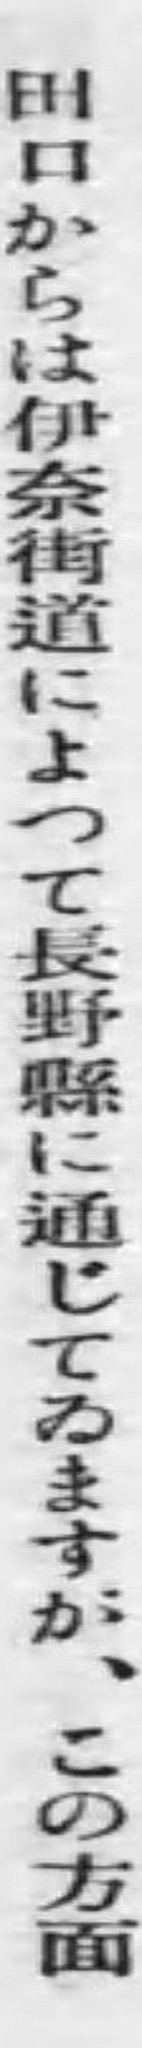田口からは伊奈街道によつて長野縣に通じてゐますが、この方面
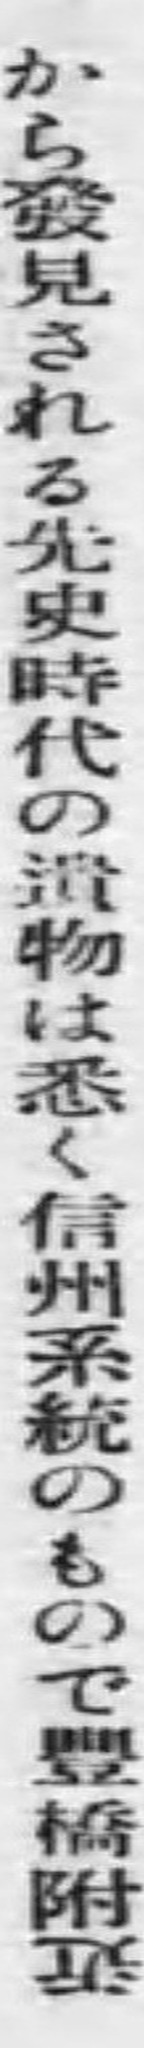から發見される先史時代の遺物は悉く信州系統のもので豊橋附近
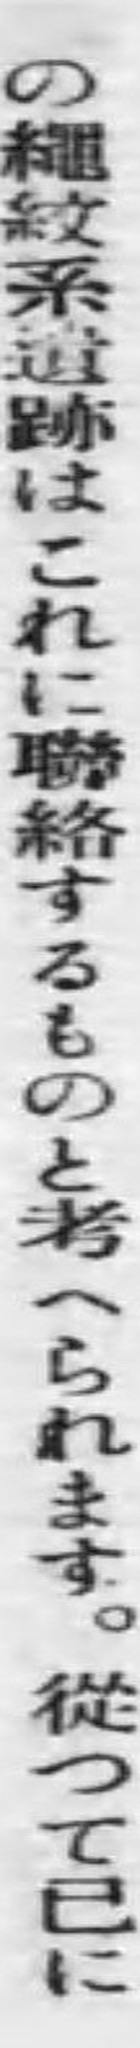の繩紋系遺跡はこれに聯絡するものと考へられます。從つて已に
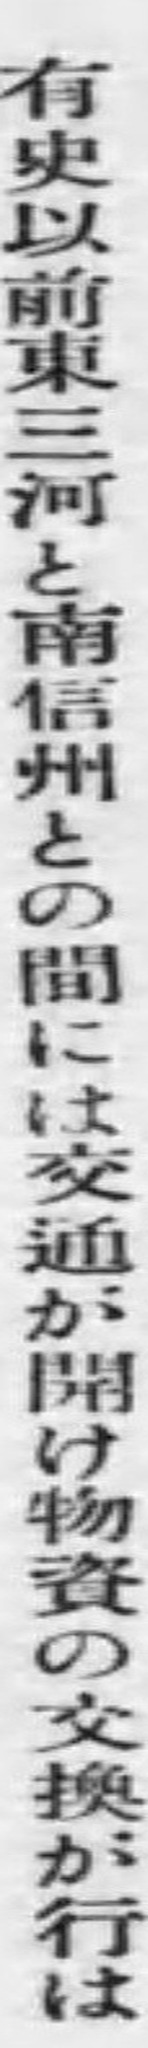有史以前東三河と南信州との間には交通が開け物資の交換が行は

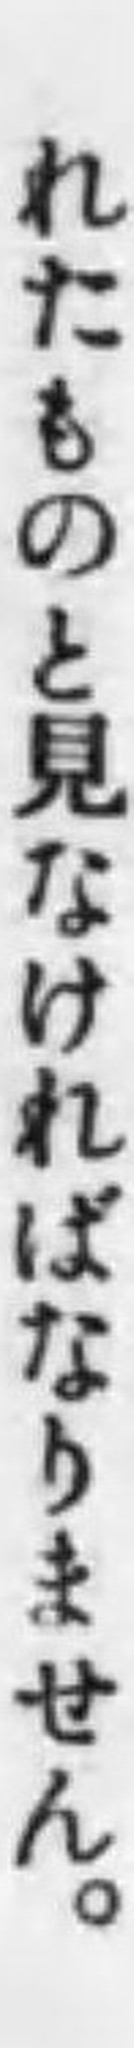れたものと見なければなりません。
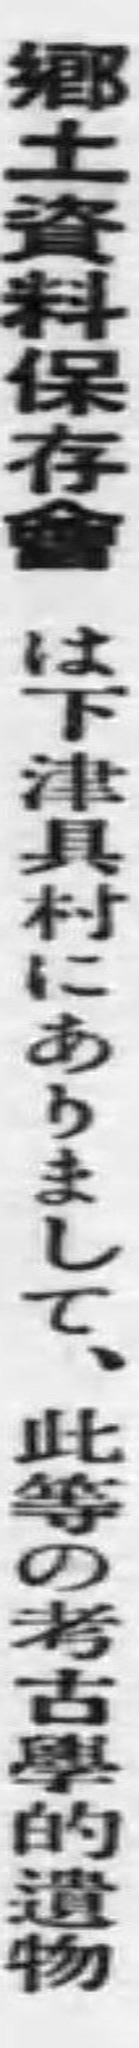郷土資料保存會は下津具村にありまして、此等の考古學的遺物
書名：東三河道中記 : 豊橋市及其附近案内
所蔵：国立国会図書館 National Diet Library, JAPAN
